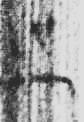之
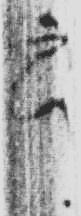也
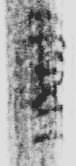聖
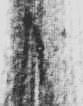人
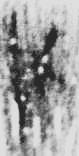比
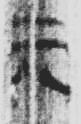亓（其）
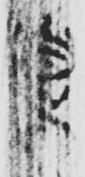頪（類）
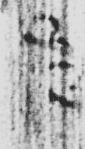而
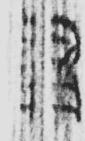侖（論）
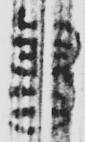會
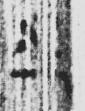之
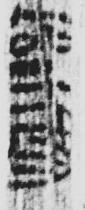○（觀）
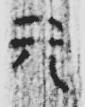亓（其）
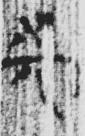先
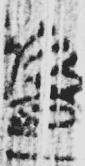後
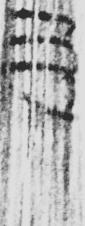而
